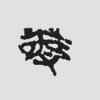發
